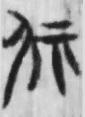𫵖
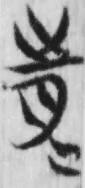之月
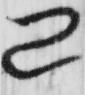己
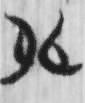卯
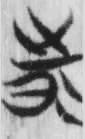之日
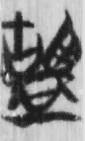○（盬）
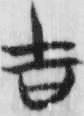吉
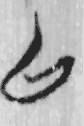㠯（以）
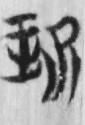○（寶）
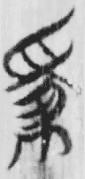○（家）
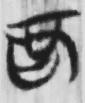爲
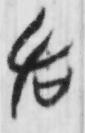左
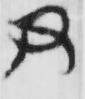尹
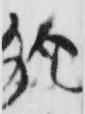{力它}
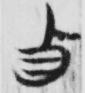貞
